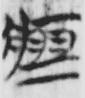瘳
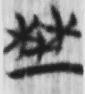埜（野）
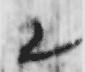乙
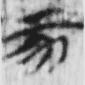亥
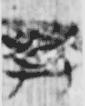登
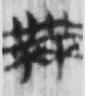無
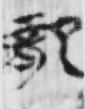龍
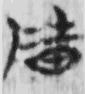○（隋）
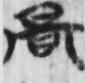晨
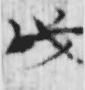戊
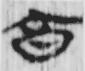亯
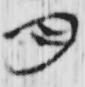月
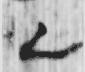乙
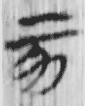亥
